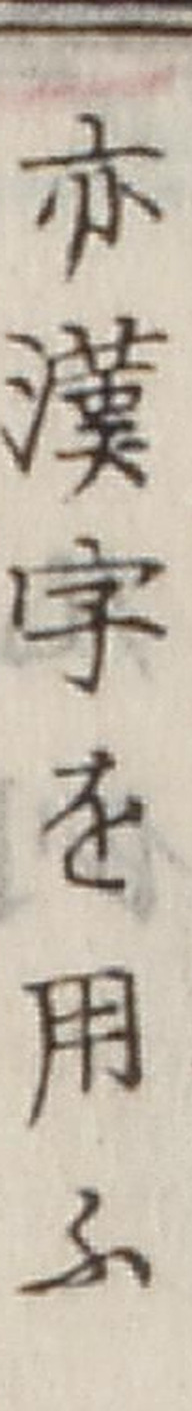亦漢字を用ふ
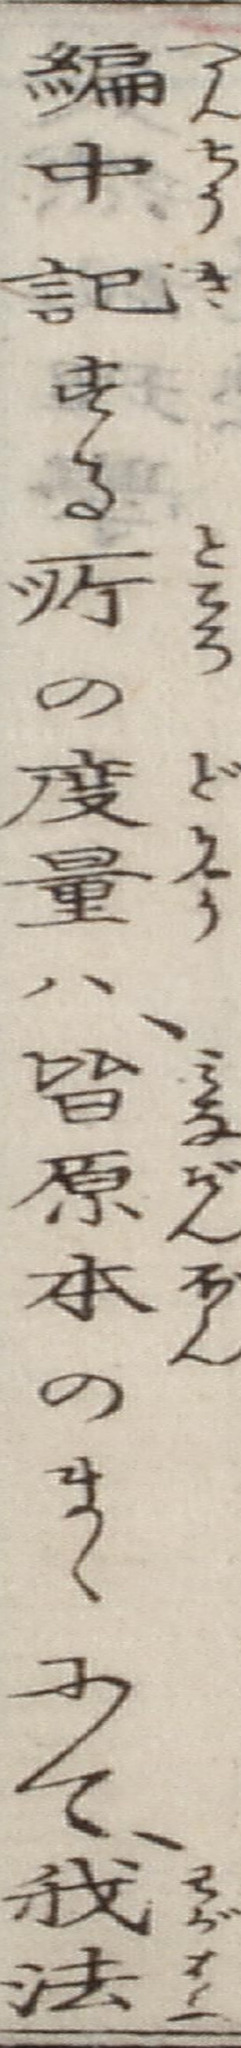編中記する所の度量は、皆原文のまゝにて、我法
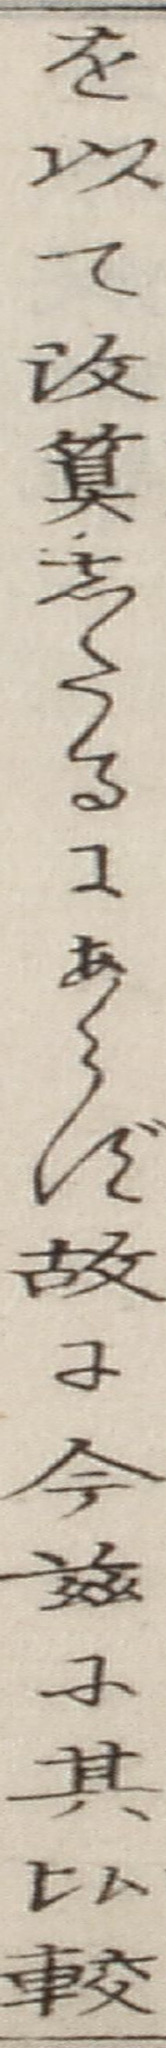を以て改算したるにあらず、故に今茲に其比較
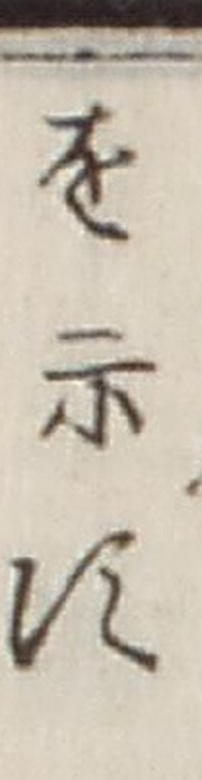を示す
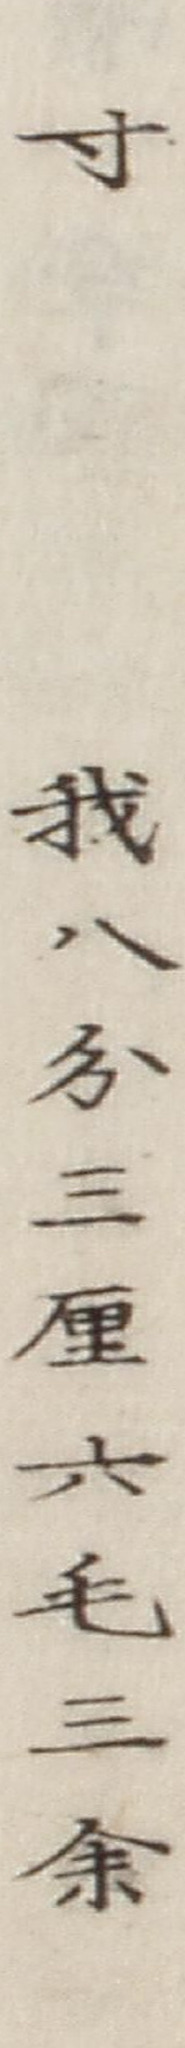寸我八分三厘六毛三余
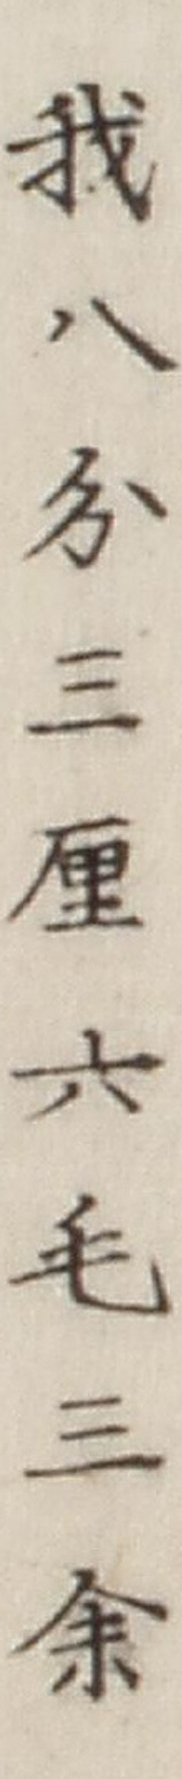寸我八分三厘六毛三余
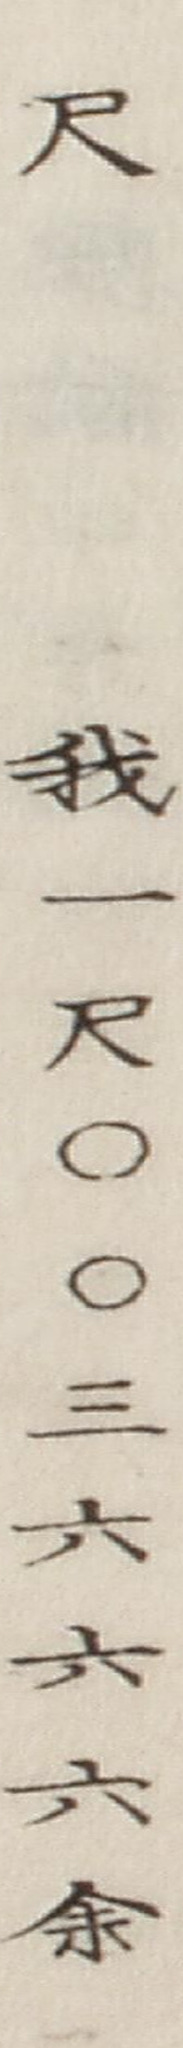尺我一尺〇〇三六六六余
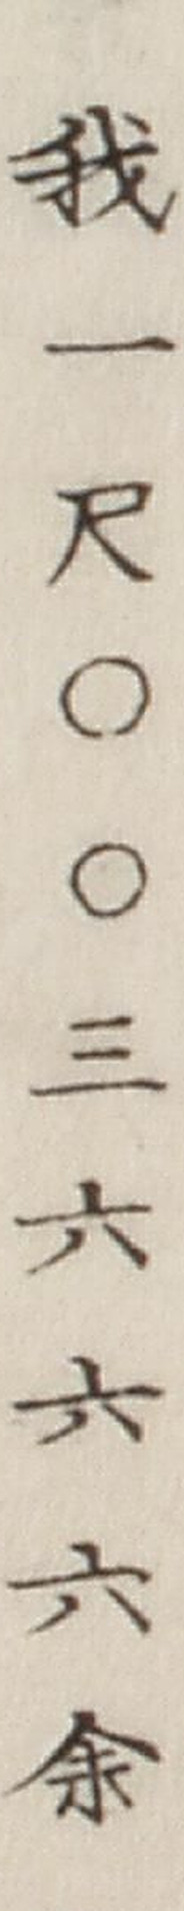尺我一尺〇〇三六六六余
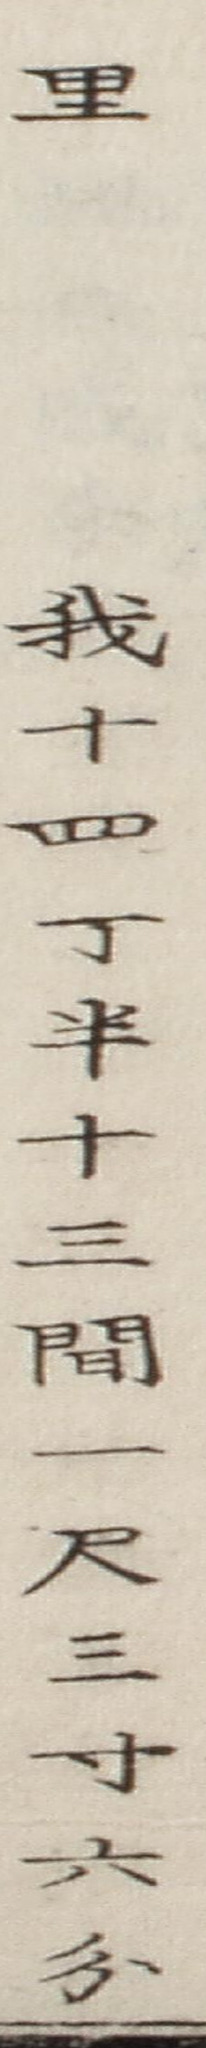里我十四丁半十三間一尺三寸六分
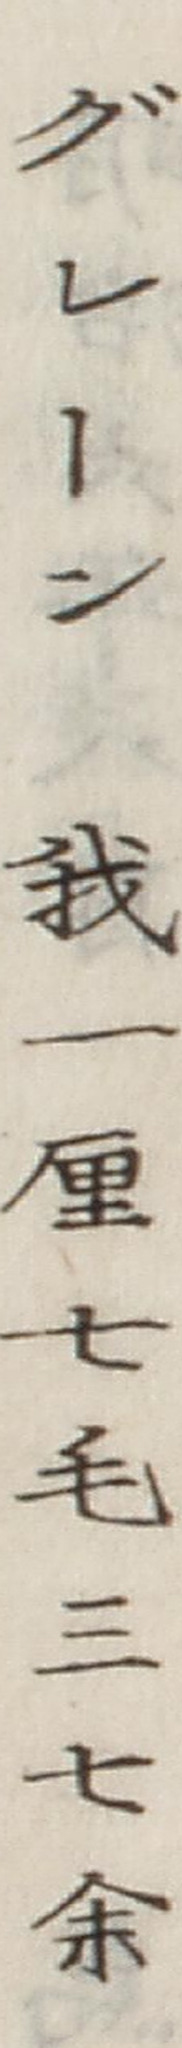グレーン我一厘七毛三七余
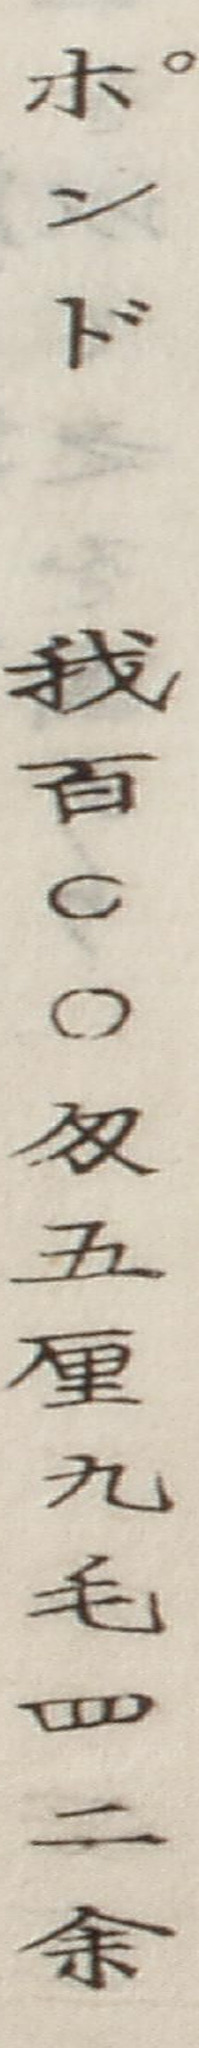ポンド我百〇〇匁五厘九毛四二余
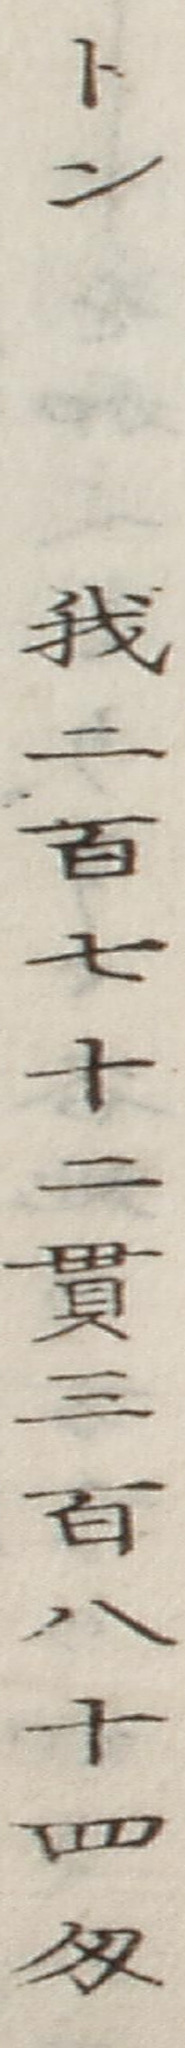トン我二百七十二貫三百八十四匁
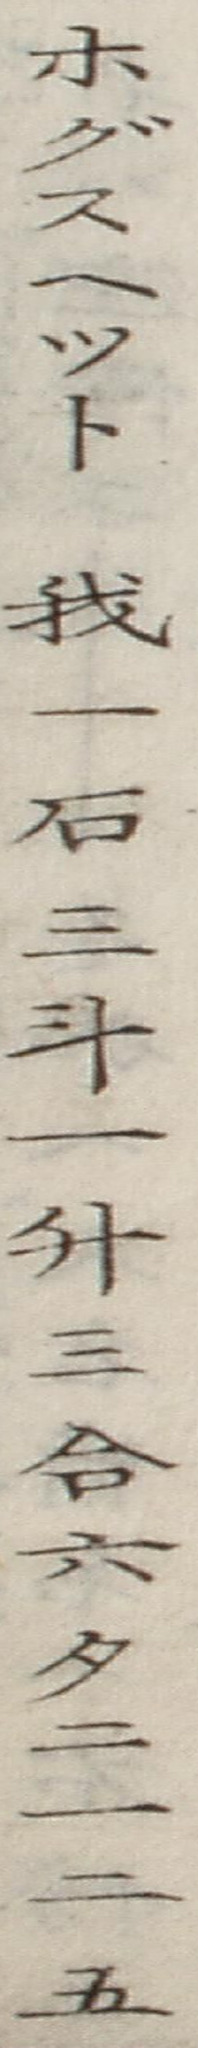ホグスヘツト我一石三斗一升三合六タニ十二五

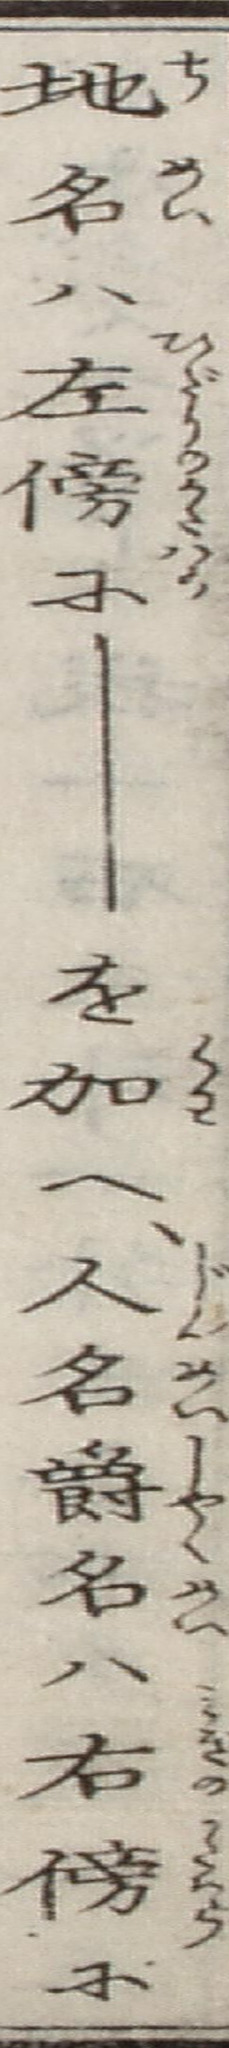地名は左傍に―を加へ、人名爵名は右傍に
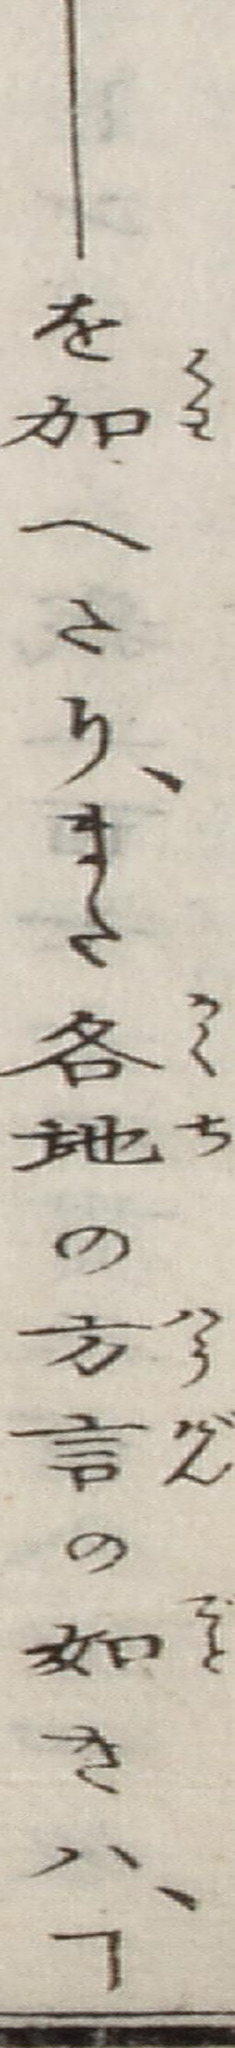―を加へたり、また各地の方言の如きは、「
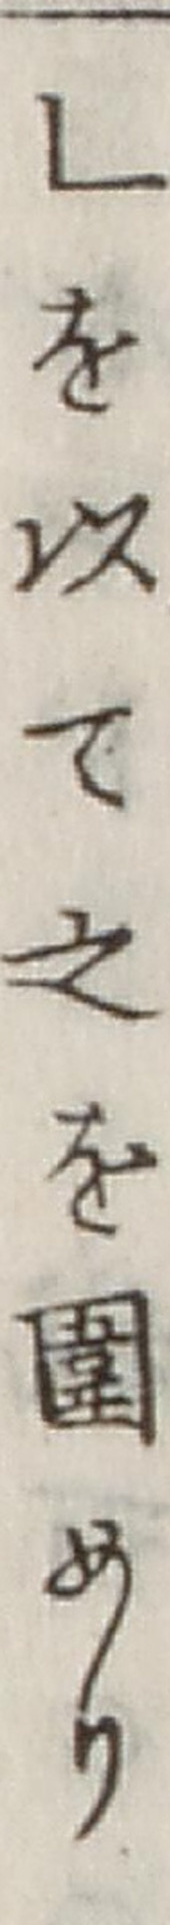」を以て之を囲めり
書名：訓蒙　天然地理學　上
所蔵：東京大学地震研究所図書室 Earthquake Research Institute Library, The University of Tokyo, JAPAN
